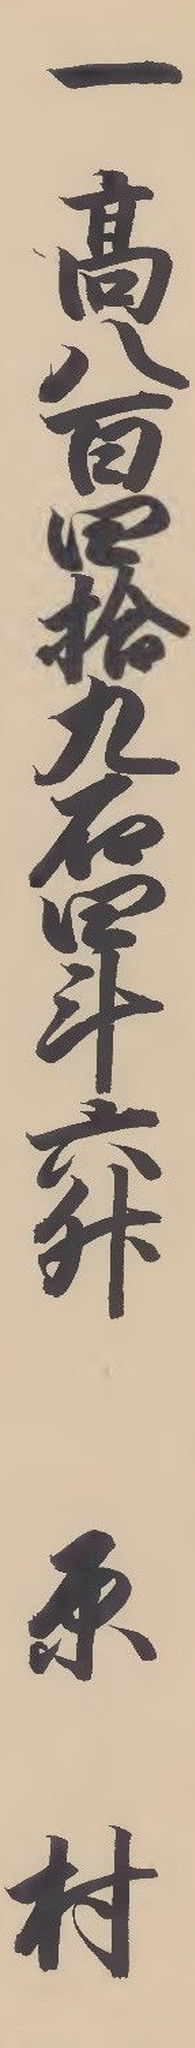一高八百四拾九石四斗六升原村
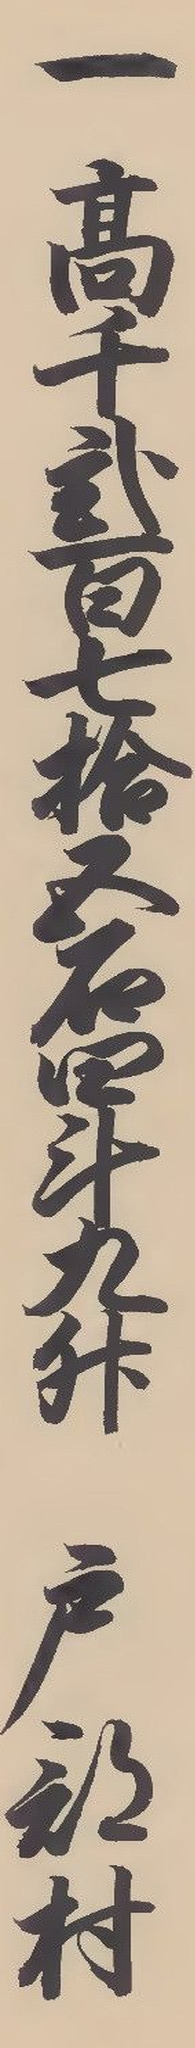一高千弐百七拾五石四斗九升戸部村
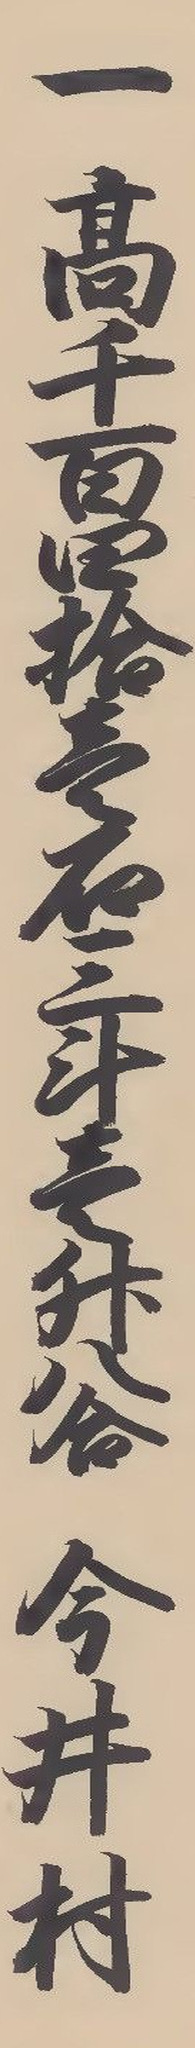一高千百四拾壱石三斗壱升八合今井村
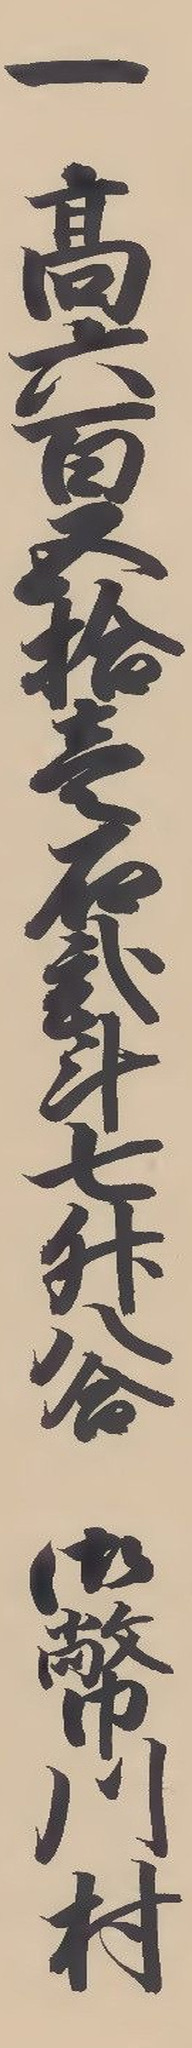一高六百五拾壱石弐斗七升八合御幣川村
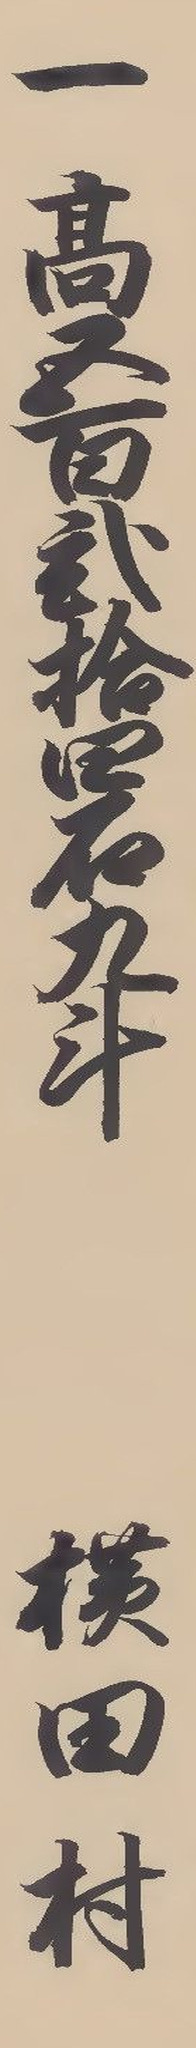一高五百弐拾四石九斗横田村
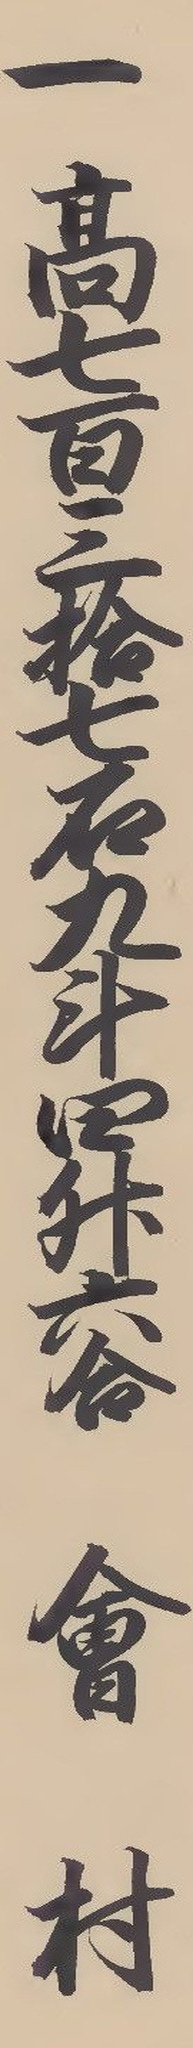一高七百三拾七石九斗四升六合会村
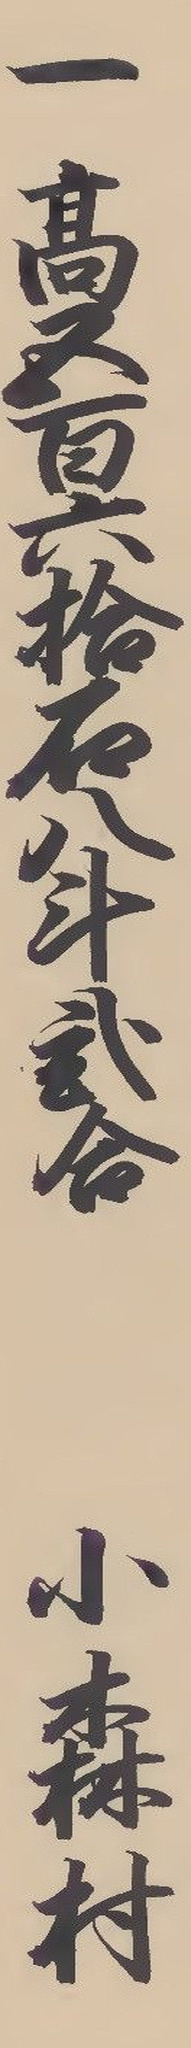一高五百六拾石八斗弐合小森村

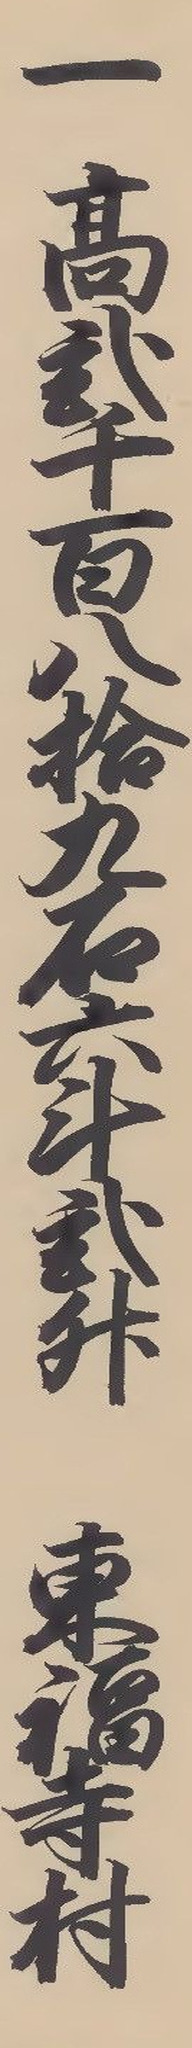一高弐千百八拾九石六斗弐升東福寺村
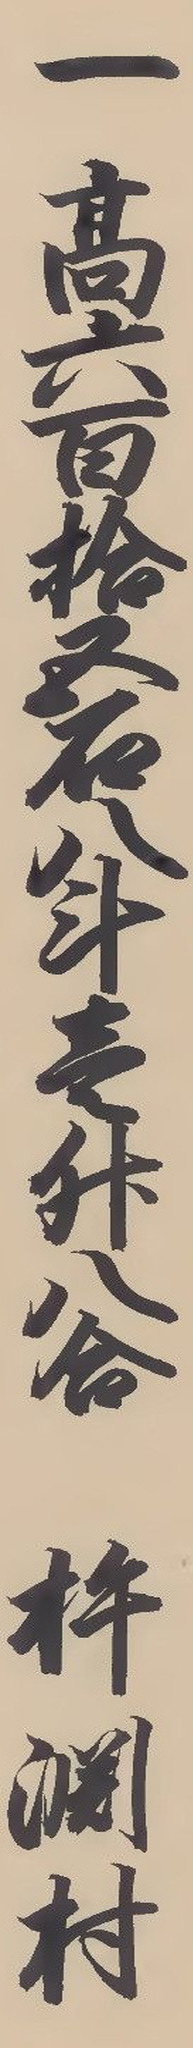一高六百拾五石八斗壱升八合杵淵村
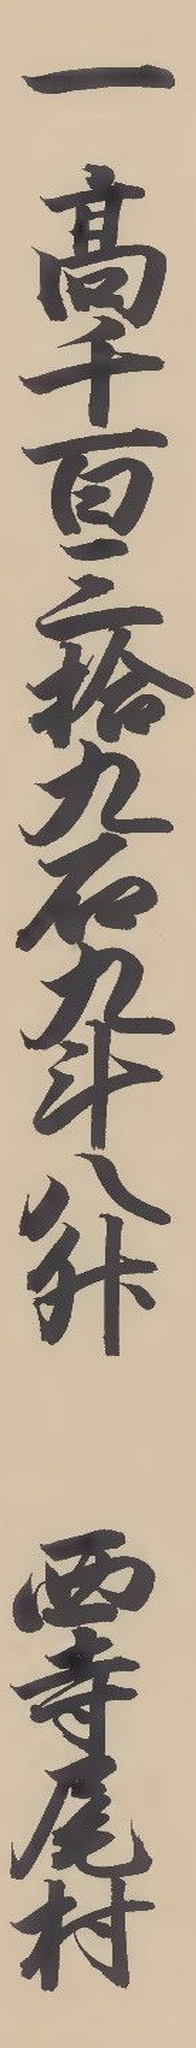一高千百三拾九石九斗八升西寺尾村
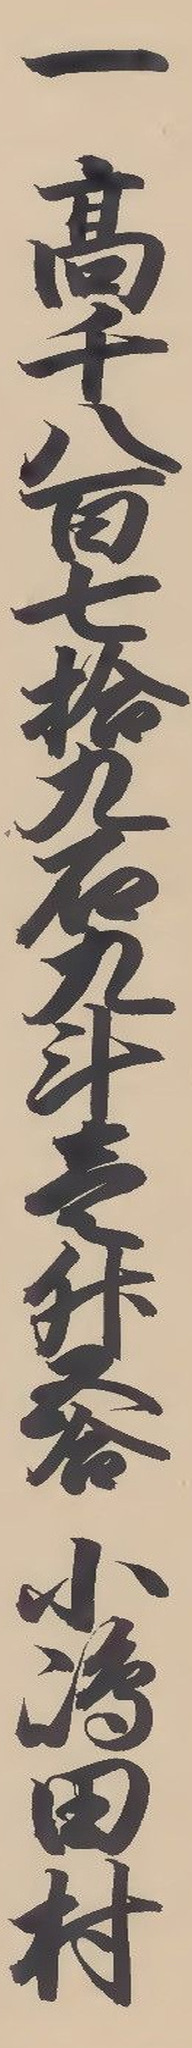一高千八百七拾九石九斗壱升五合小島田村
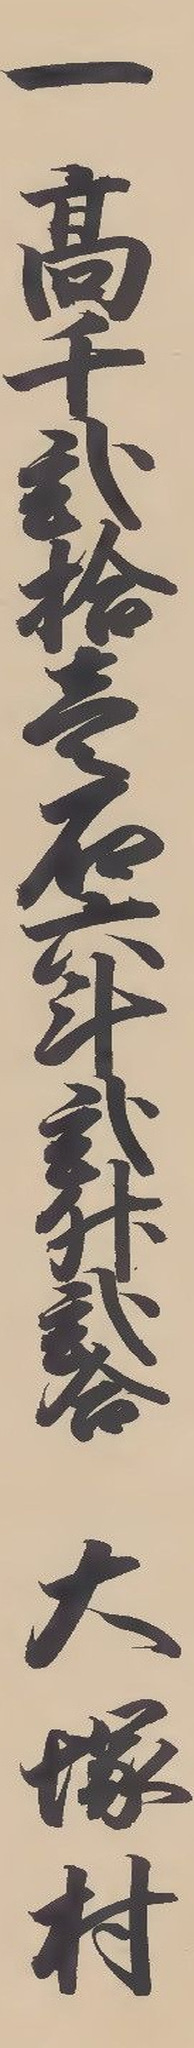一高千弐拾壱石六斗弐升弐合大塚村
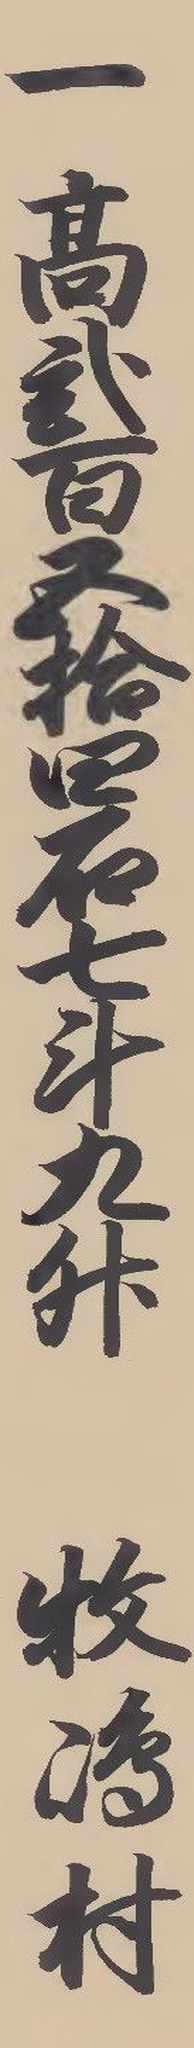一高弐百五拾四石七斗九升牧島村
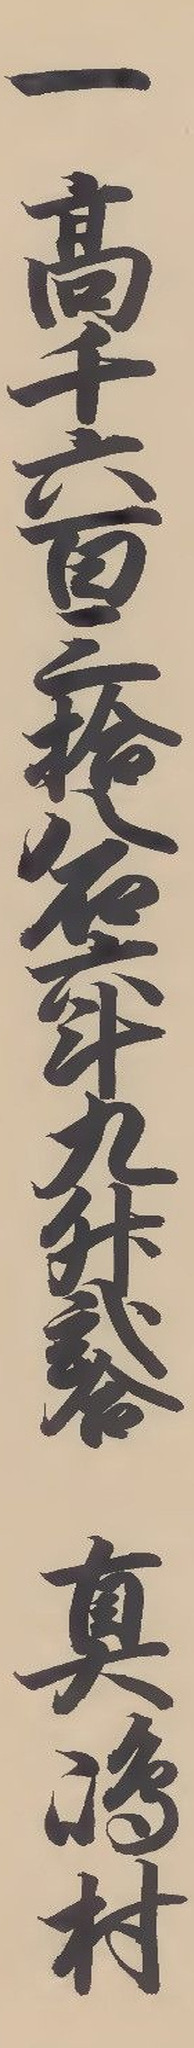一高千六百三拾八石六斗九升弐合真島村

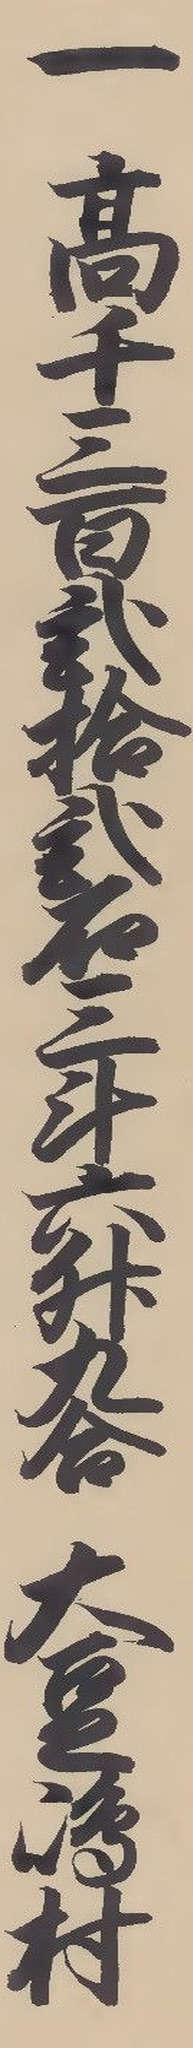一高千三百弐拾弐石三斗六升九合大豆島村
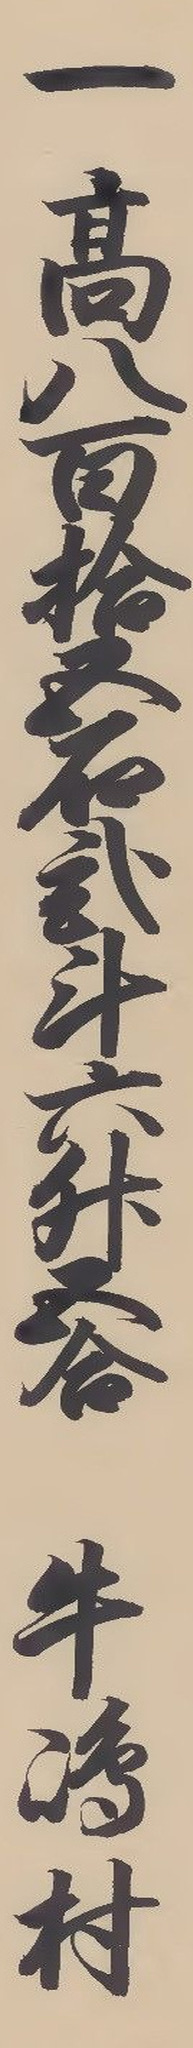一高八百拾五石弐斗六升五合牛島村
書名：信濃国郷帳
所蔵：国立公文書館 National Archives of Japan
